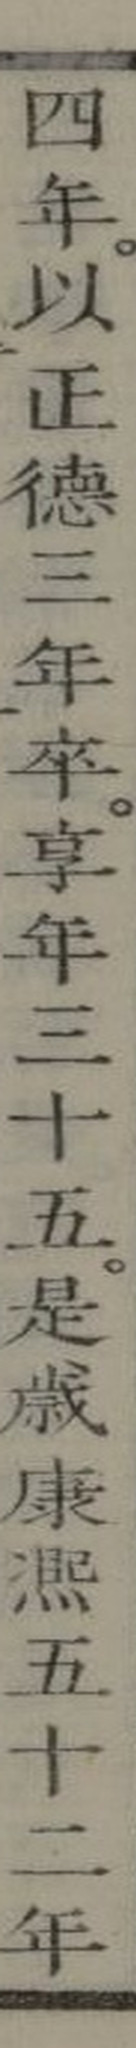四年。以正德三年卒。享年三十五。是歳康凞五十二年
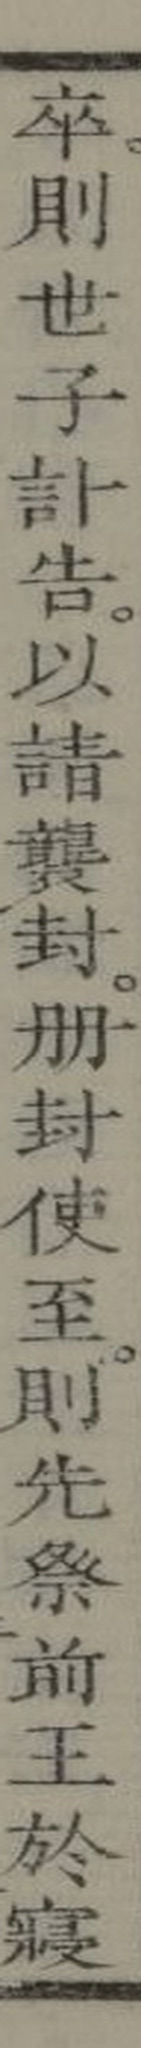卒。則世子訃告。以請襲封。册封使至。則先祭前王於寢

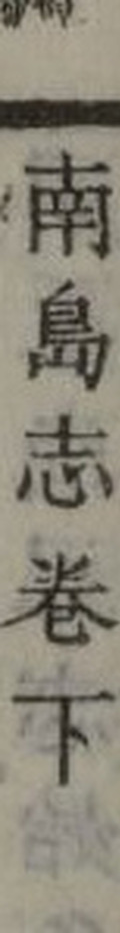南島志巻下
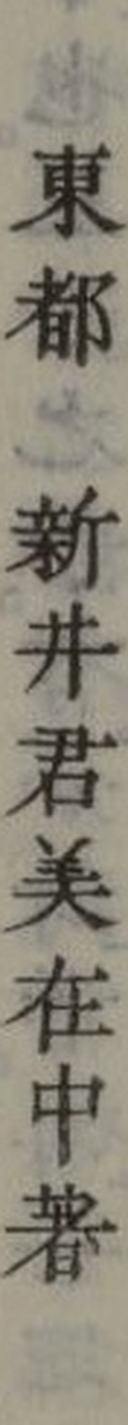東都新井君美在中著
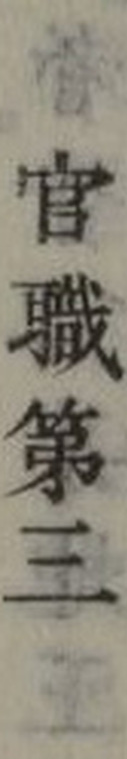官職第三
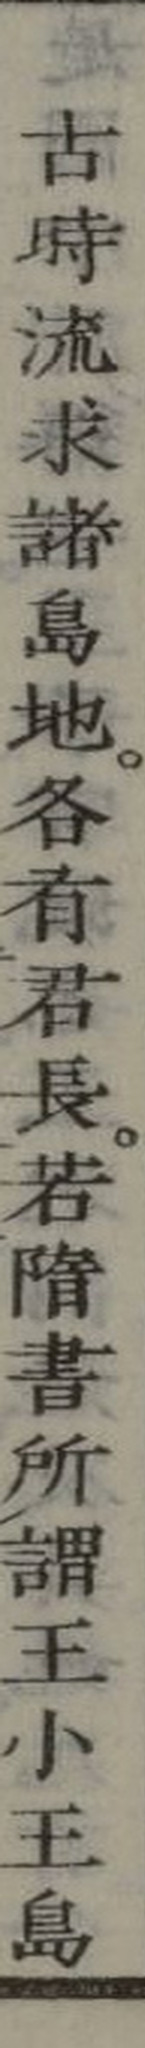古時流求諸島地。各有君長。若隋書所謂王小王島
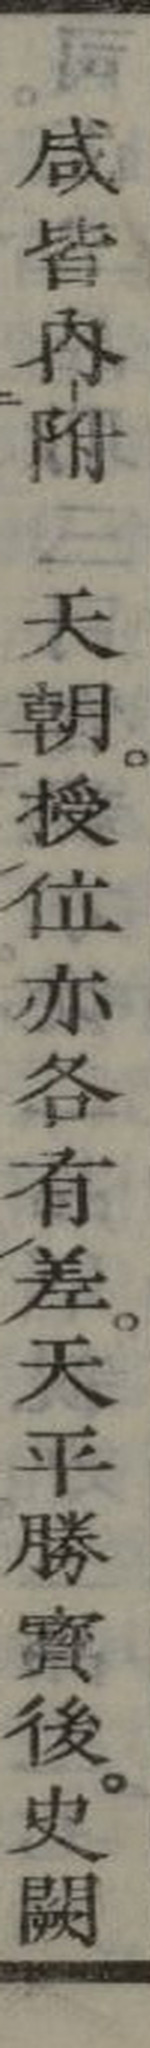咸皆内-附天朝。授位亦各有差。天平勝寳後。史闕
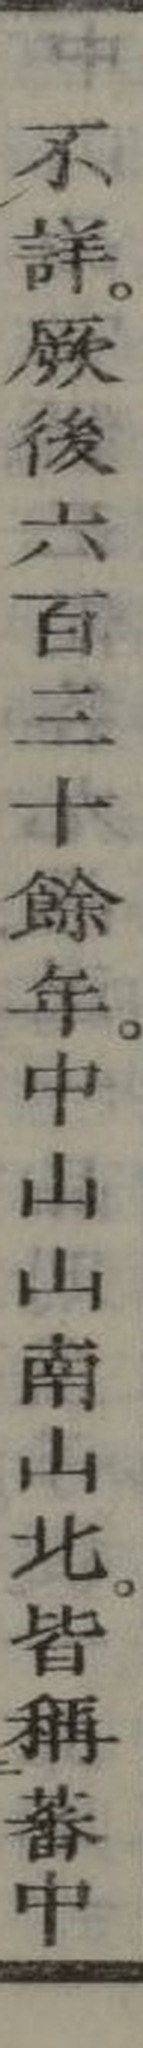不詳。厥後六百三十餘年。中山山南山北。皆稱蕃中
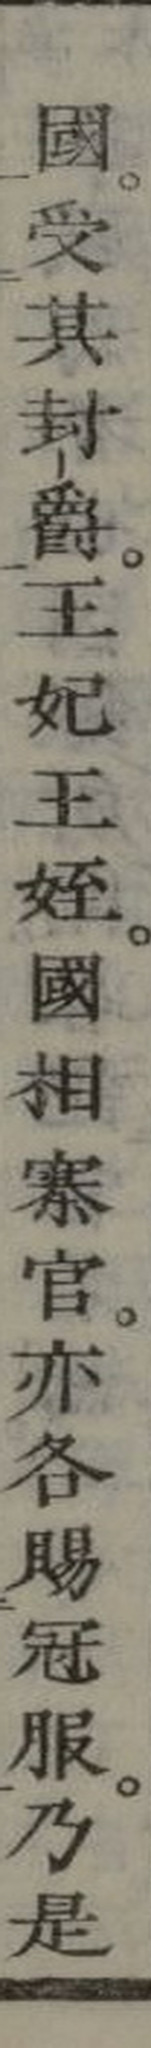國。受其封-爵。王妃王姪。國相寨官。亦各賜冠服。乃是
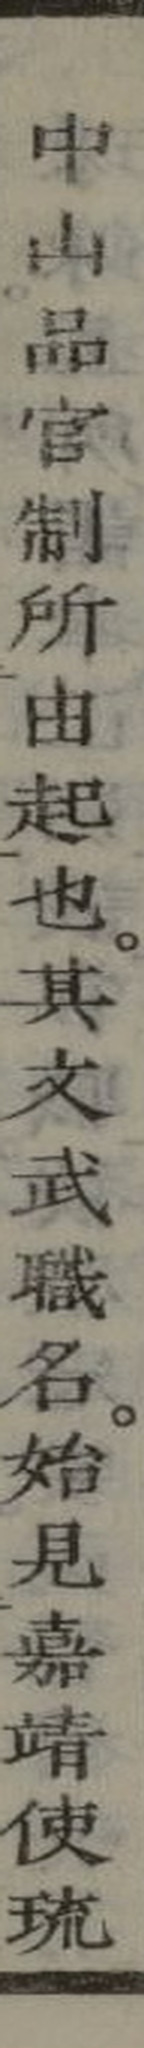中山品官制所由起也。其文武職名。始見嘉靖使琉

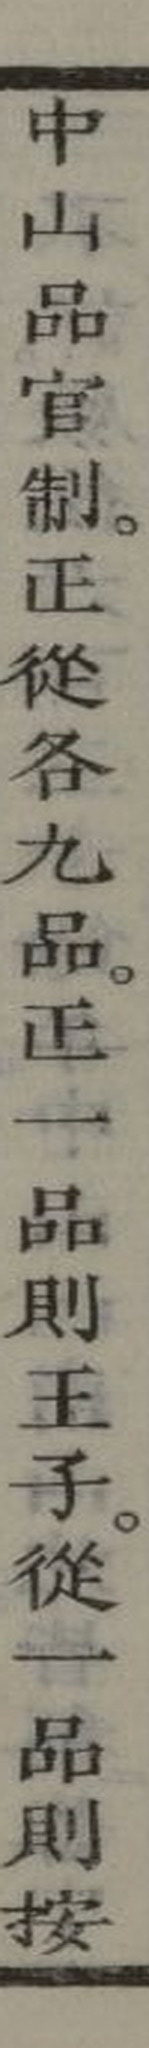中山品官制。正從各九品。一品則王子。從一品則按
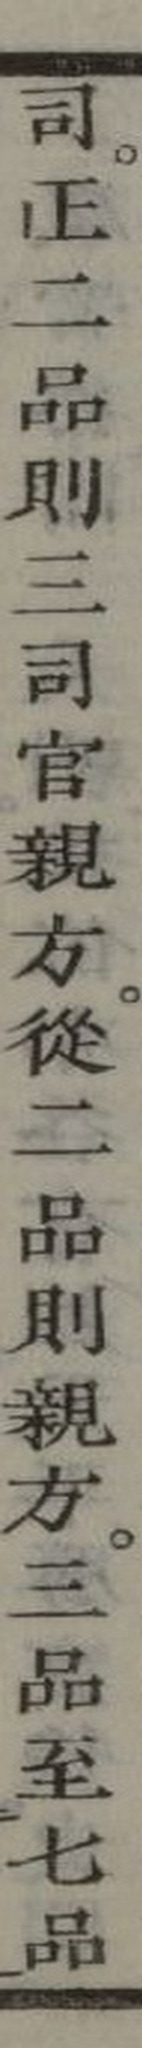司。正二品則三司官親方。從二品則親方。三品至七品
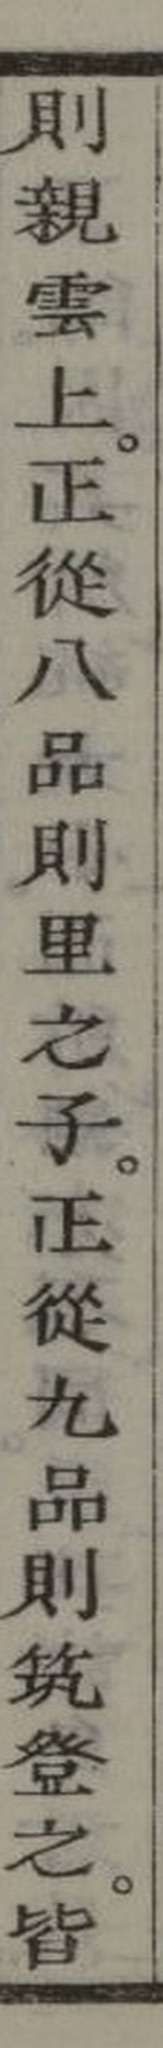則親雲上。正從八品則里之子。正從九品則筑登之。皆
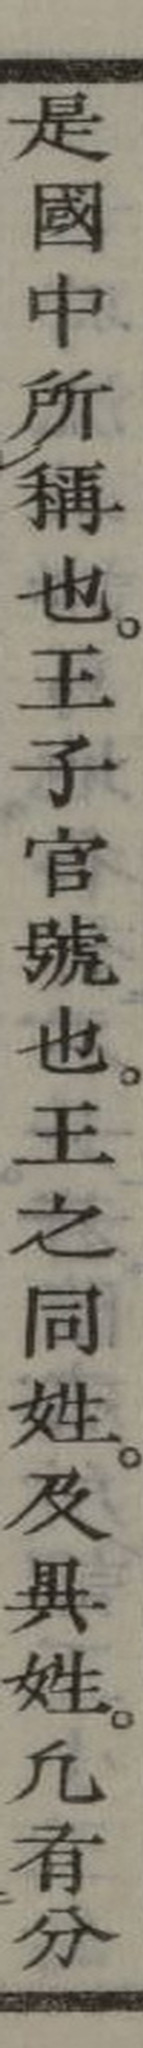是國中所稱也。王子官號也。王之同姓。及異姓。凢有分
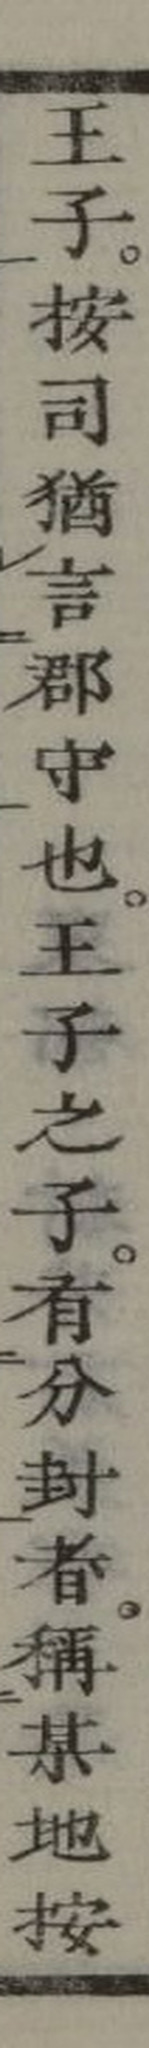王子。按司猶言郡守也。王子之子。有分封者。稱某地按
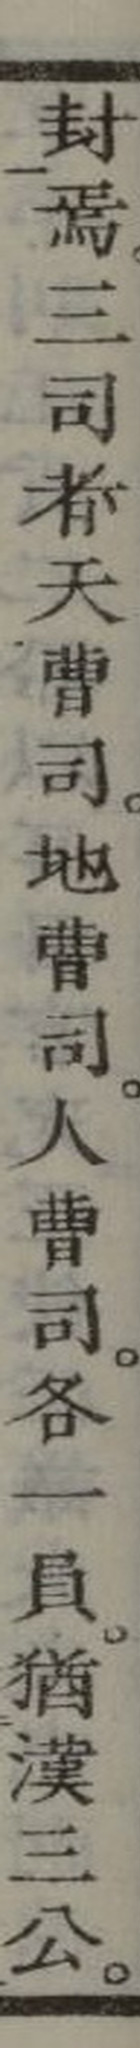封焉。三司者天曹司。地曹司。人曹司。各一員。猶漢三公。
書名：南島志 呂
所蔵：University of the Ryukyus Library
